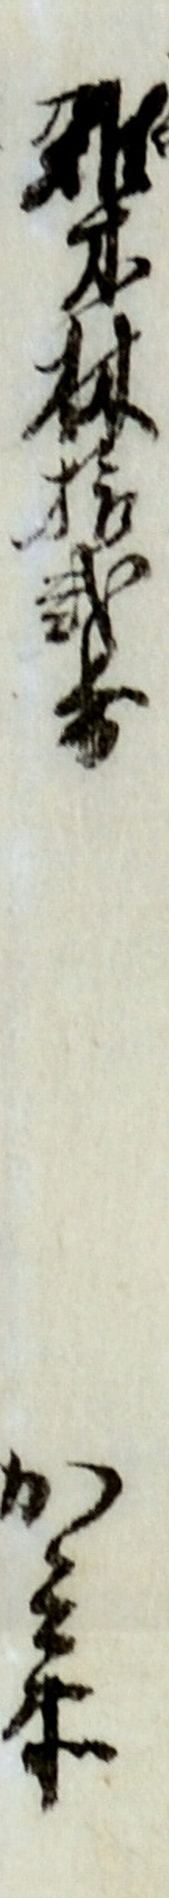雑木林拾弐歩加兵衛
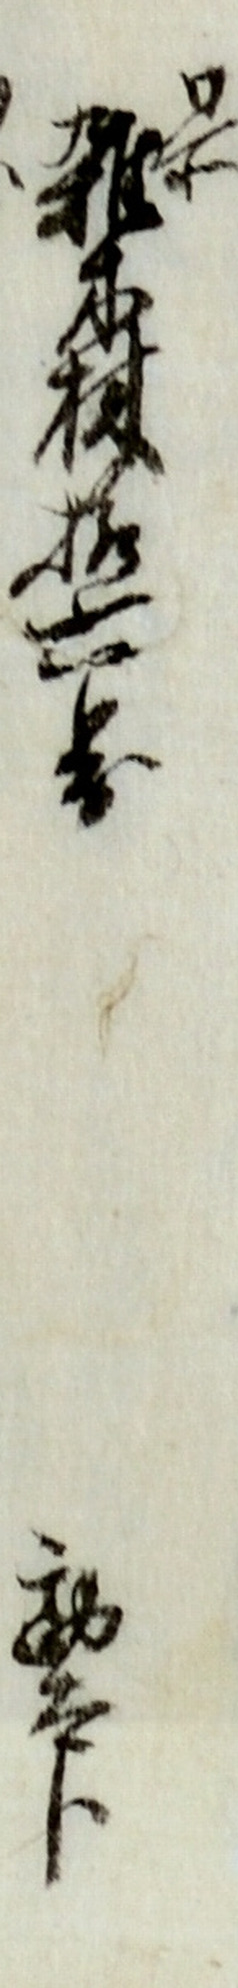雑木林拾六歩勘太郎
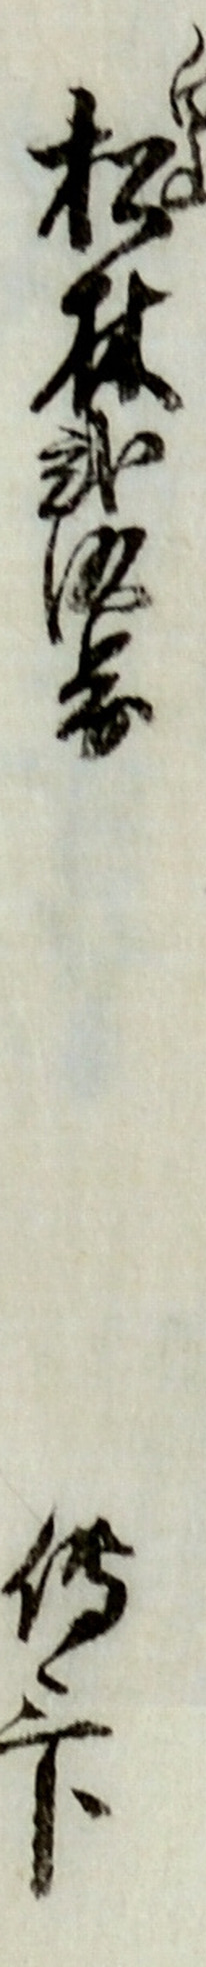松林弐畝歩伝三郎

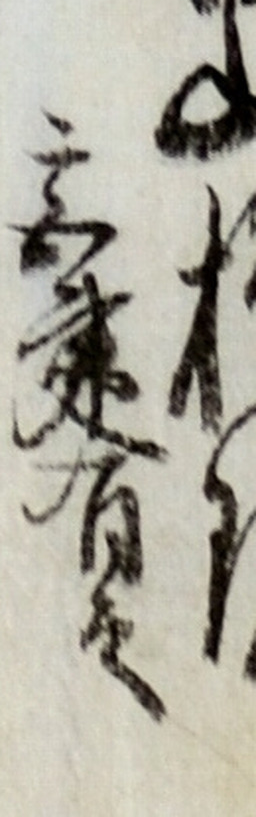宮建有之
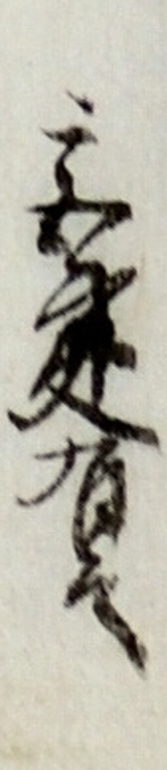宮建有之
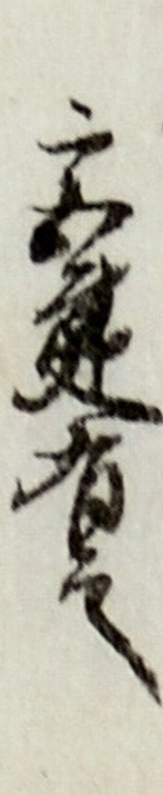宮建有之
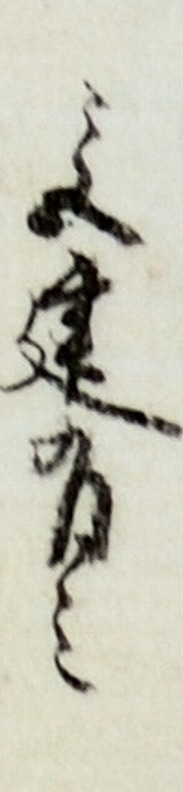宮建有之
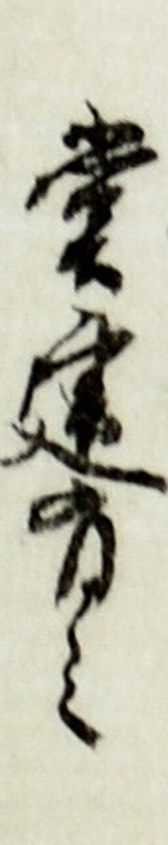堂建有之
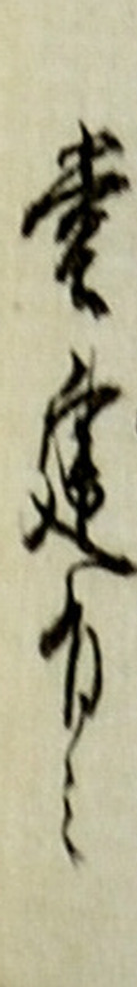堂建有之
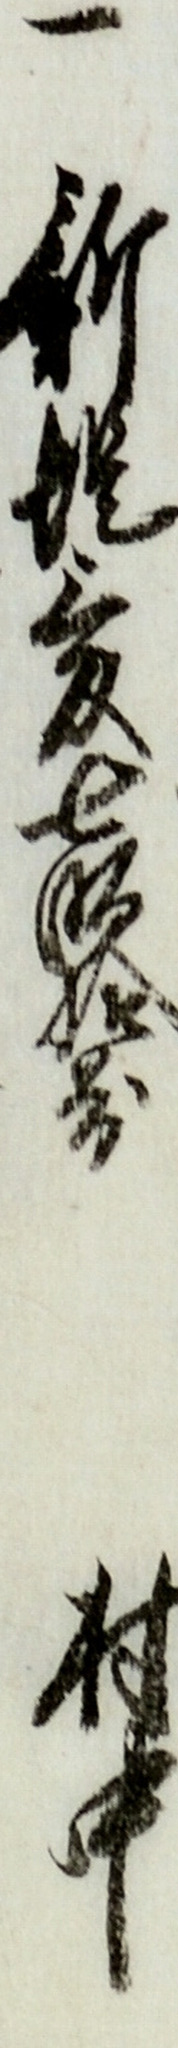一新堤三反七畝拾歩村中
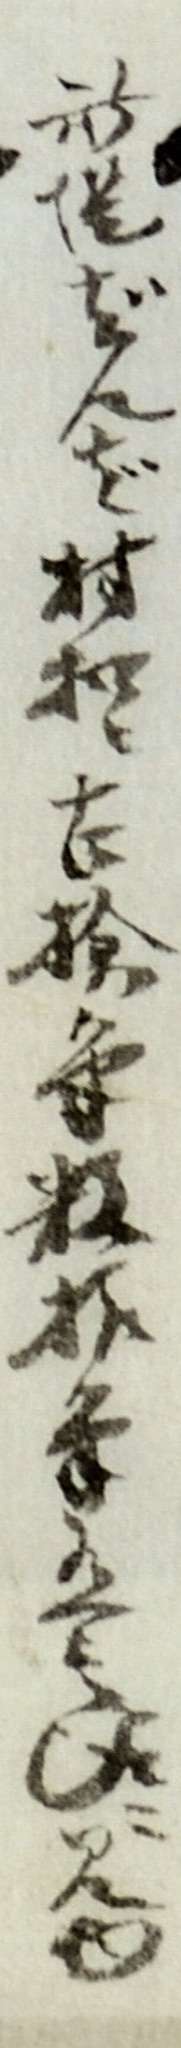此堤ばんば村扣ニ古検筆数拾筆有之趣ニ見ゆ
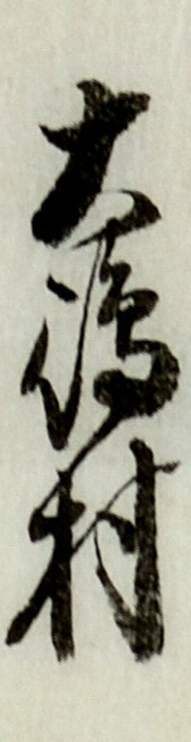大島村
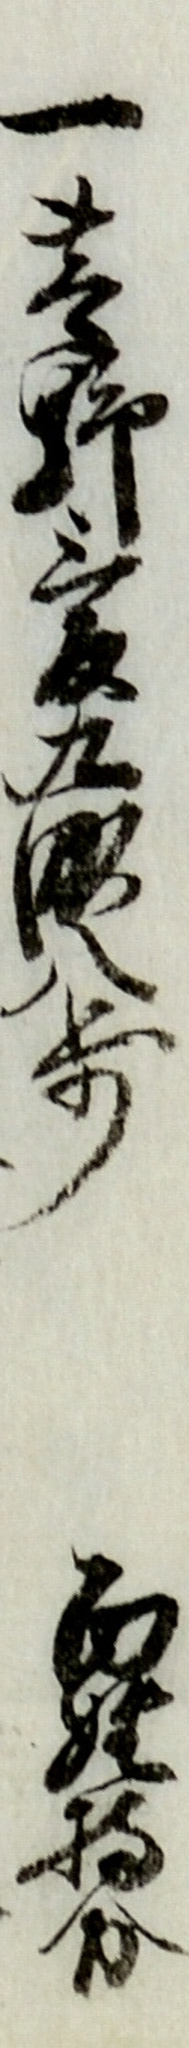一芝野三反九畝八歩百姓持分
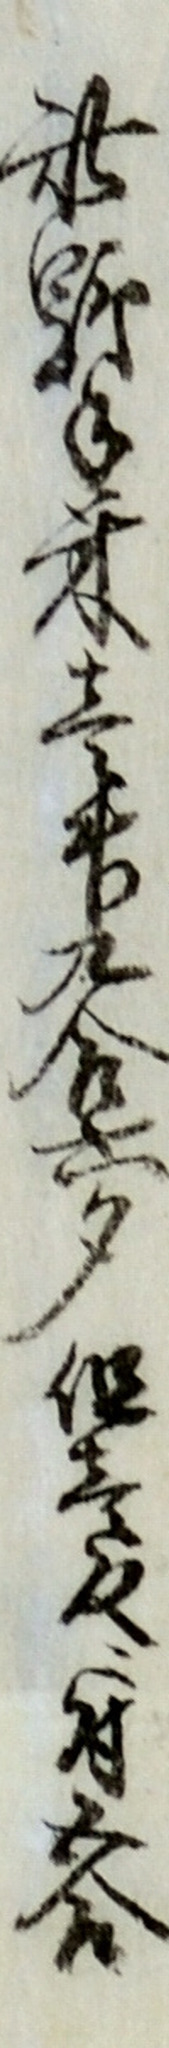此野手米壱升九合六勺但壱反ニ付五合

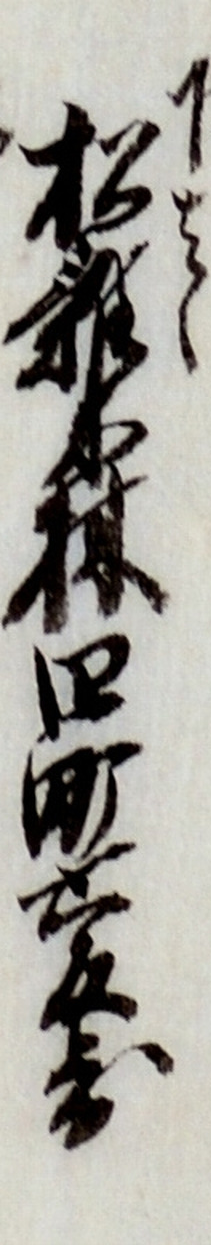松雑木林四町六反歩村中
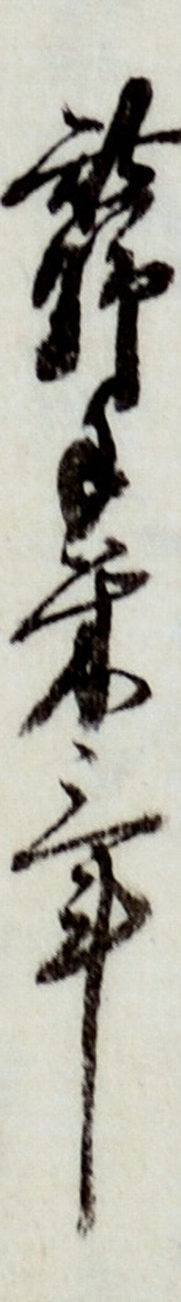此野手米三斗
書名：御領分中山林社地手控
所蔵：伊那市立高遠町図書館・合同会社AMANE
